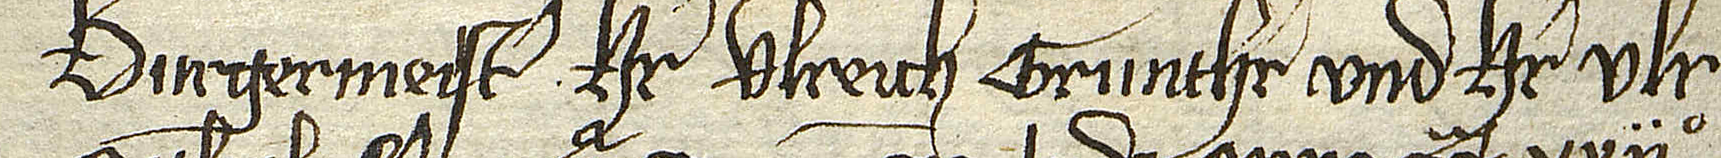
Burgermeiſt* . Hr* Vlreich Grunthr* vnd Hr* vlr*
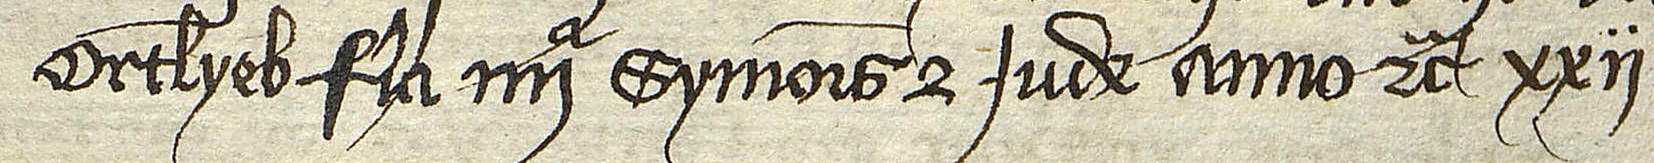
Ortlyeb f*ia iiii* Symois* @ Iude anno ec* xxii*
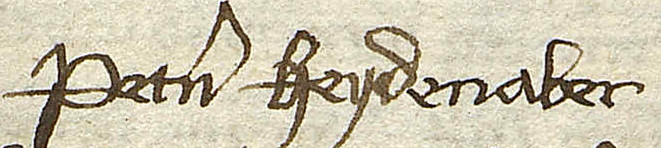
Petn* Heydenaber
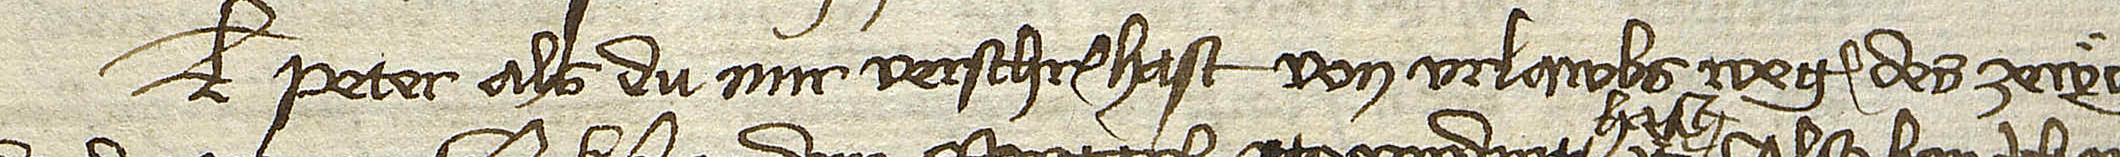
L* peter als du mir verſchr* haſt von vrlawbs weg* deʒ ʒewgs
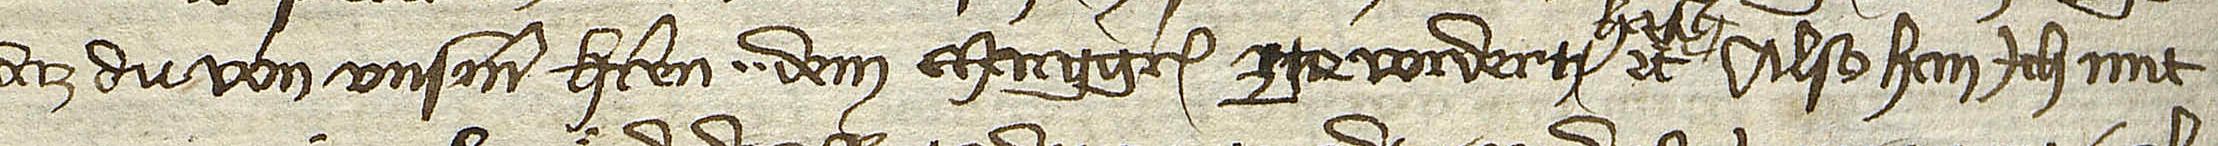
daʒ du von vnſ*m h*ren ~ dem Marggr* gevordert ec* Alſo han Ich mit
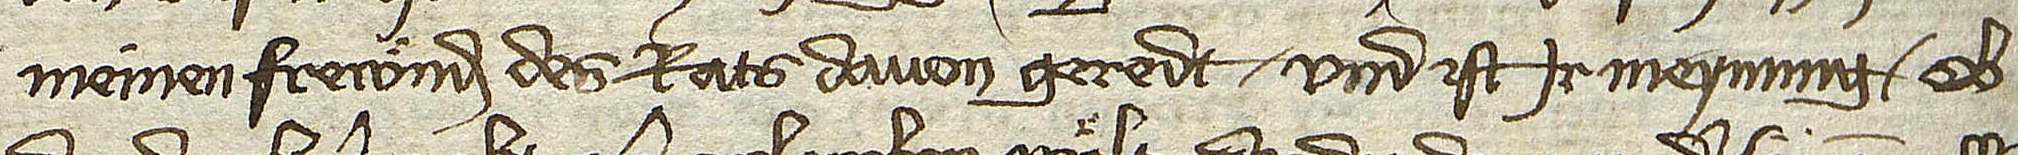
meinen frewnd* des Rats dauon geredt / vnd ist Ir meynung / Ob
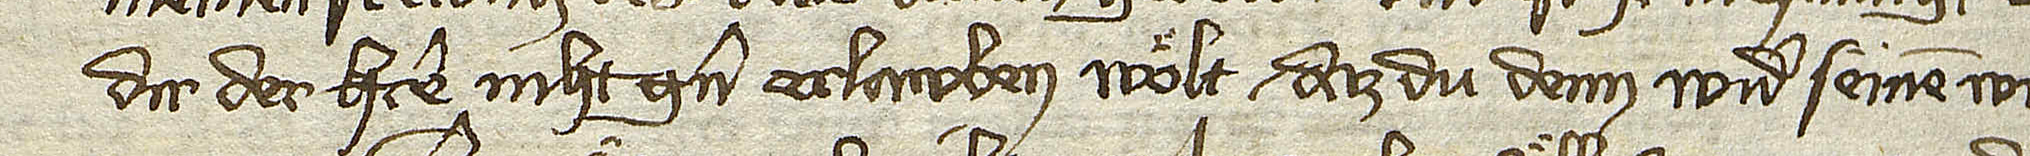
dir der Hre* niht gn* erlawben wölt / daʒ du denn wid* ſeine* wille*
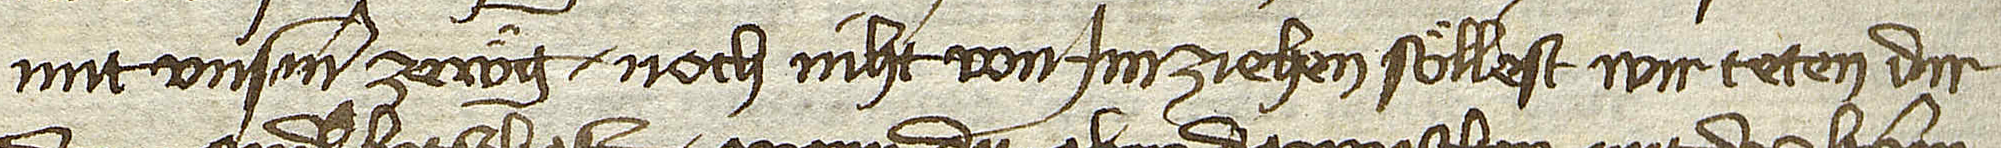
mit vnſ*m ʒewg / noch niht von Im ʒiehen ſölleſt wir teten dir
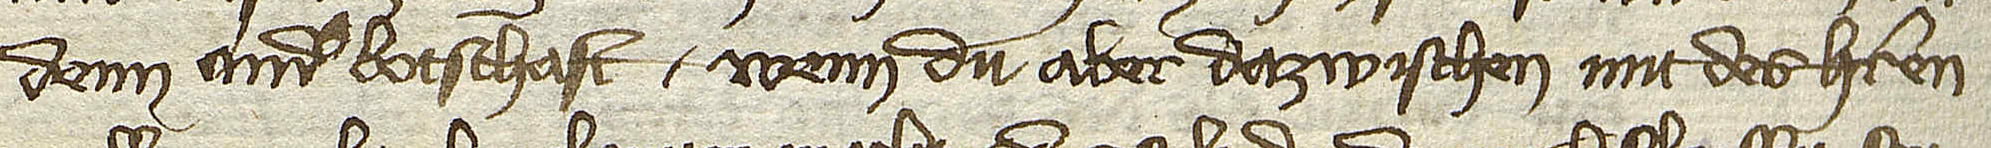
denn and* botſchaft / wenn du aber daʒwiſchen mit des Hr*en
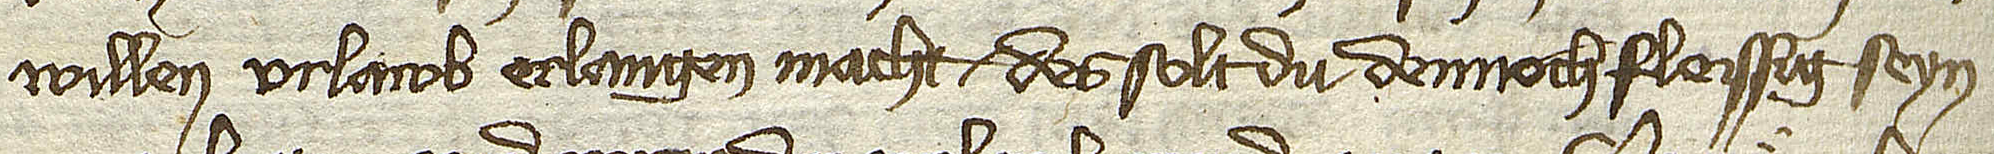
willen vrlawb erlangen macht / des ſolt du dennoch fleiſſig ſeyn
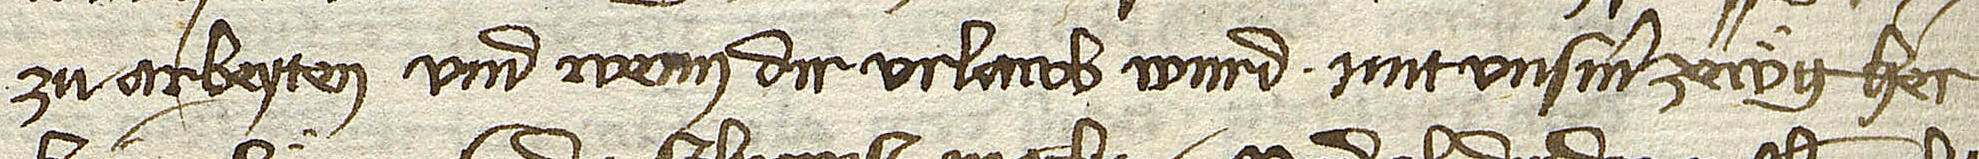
ʒu arbeyten vnd wenn dir vrlawb wurd . mit vnſ m* ʒewg her
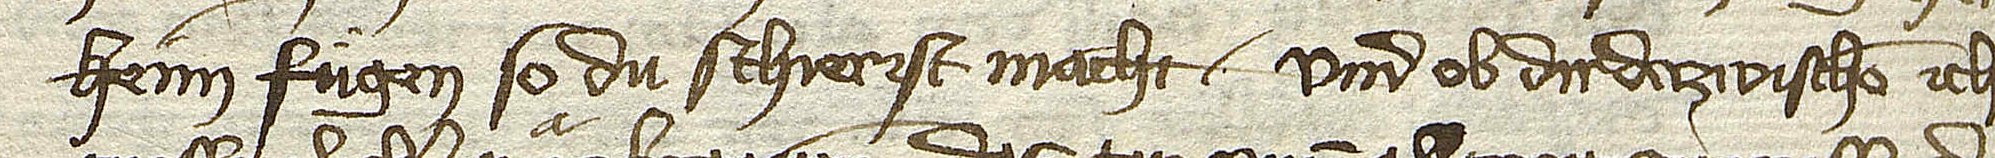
heim fügen ſo du ſchieriſt macht / vnd ob dir daʒ*wiſche* icht
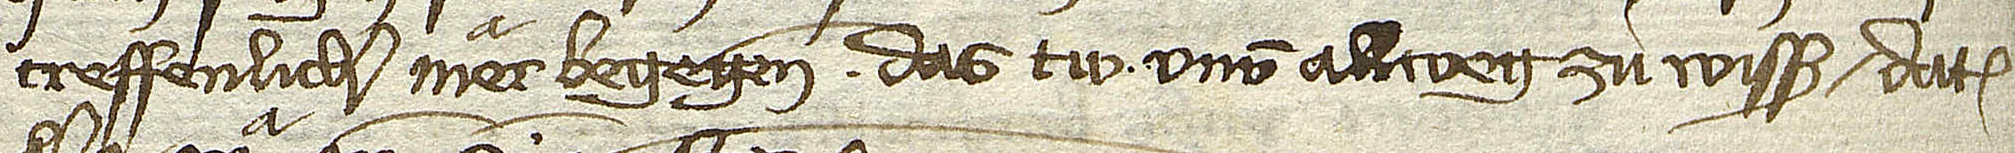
treffenlich* mër begegen* . das tw vns allweg ʒu wiſſ* / dat*
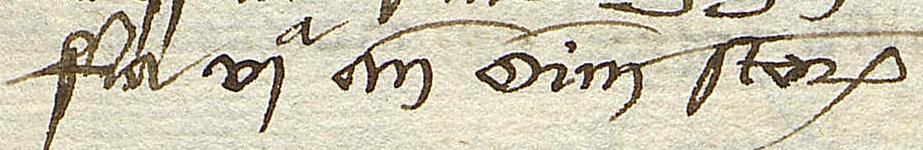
f*ia vi* an* Omi* ſco*
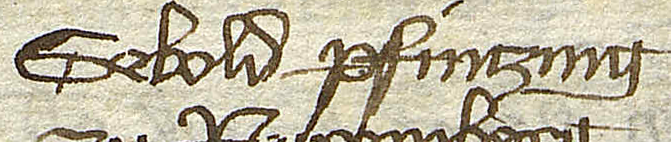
Sebold Pfinʒing
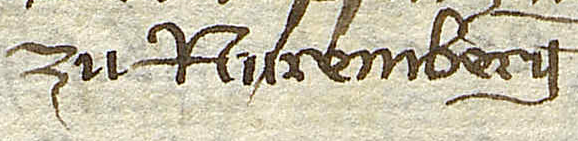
ʒu Nuremberg
